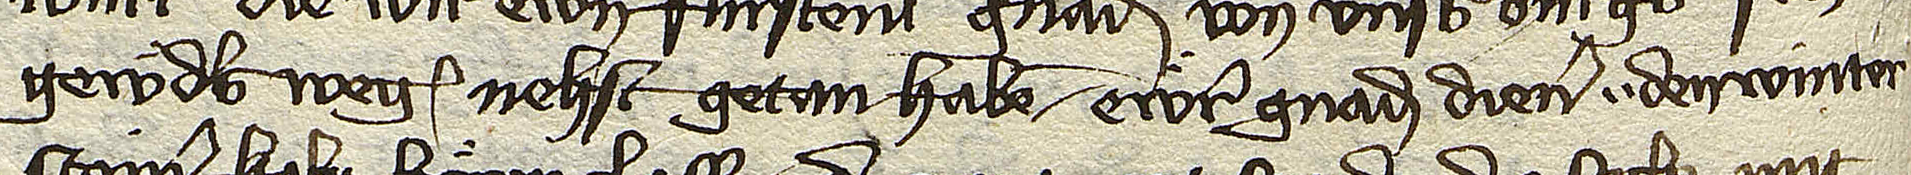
geẅd*s weg* nehſt getan habe* / eẅr* gnad* dien* ~ den winter
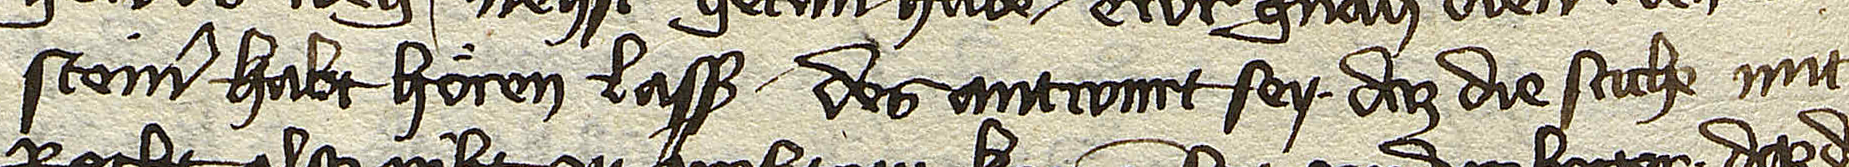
ſtein* habt hören laſſ* / Des antwurt ſey . daʒ die ſache mit
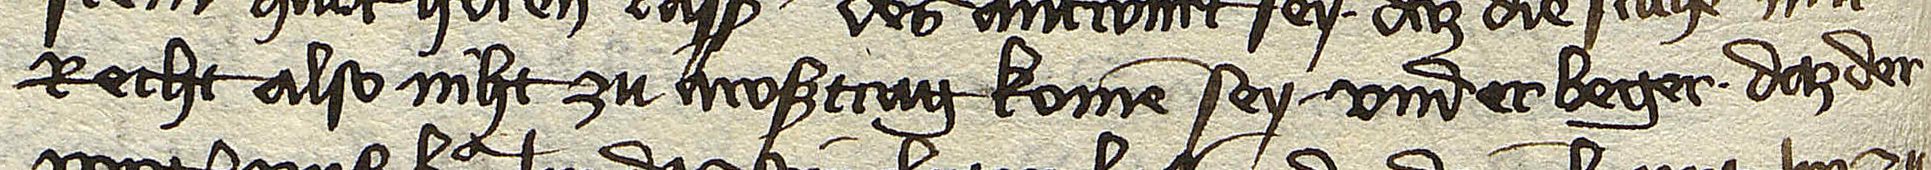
Recht alſo niht ʒu awſʒtrag kome* ſey vnd er beger . daʒ der
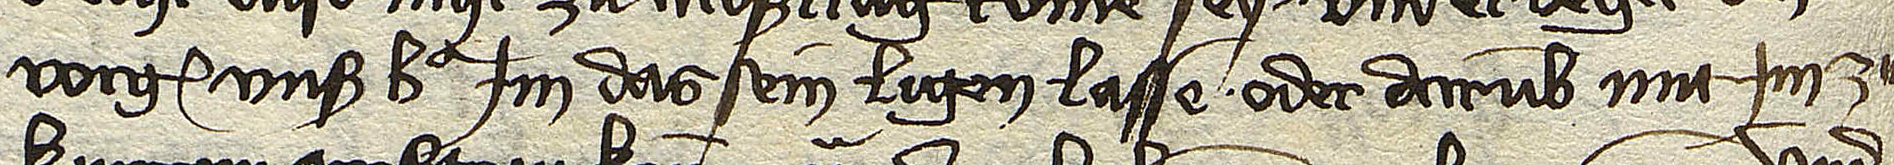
vorg* vnſ* b* Im das ſein ligen laſſe . oder darub* mit Im ʒu
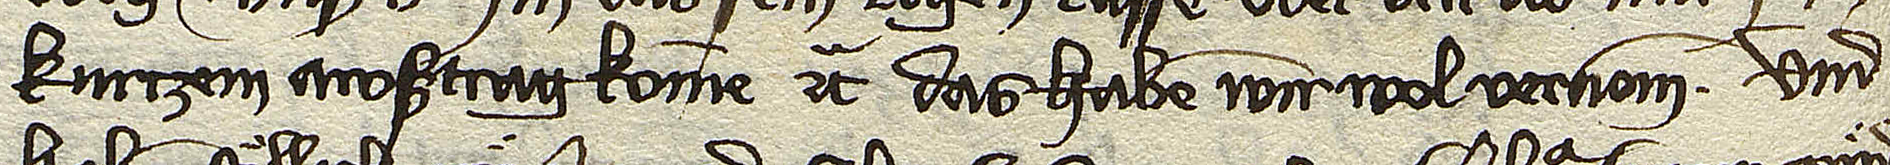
kurcʒem awſʒtrag kome* ec* das habe* wir wol vernom* . Vnd
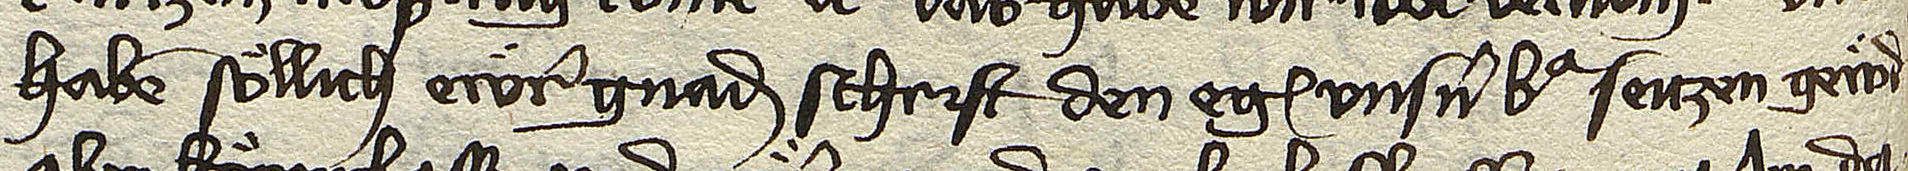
habe* ſöllich eẅr* gnad* ſchrift den eg* vnſ*n b* ſeicʒen geẅd*
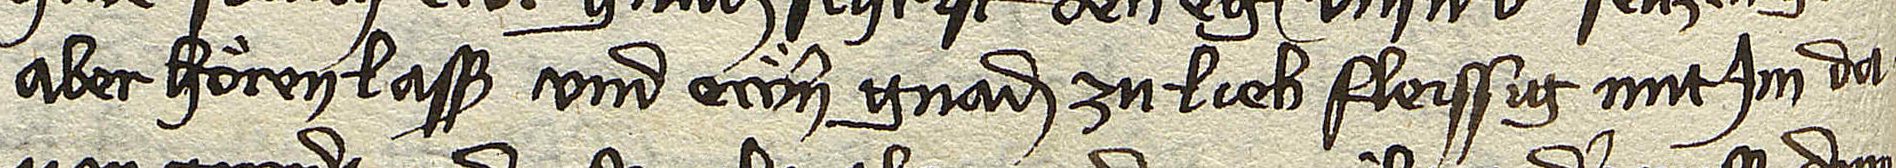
aber hören laſſ* vnd eẅ*n gnad* ʒu lieb fleiſſig mit Im da
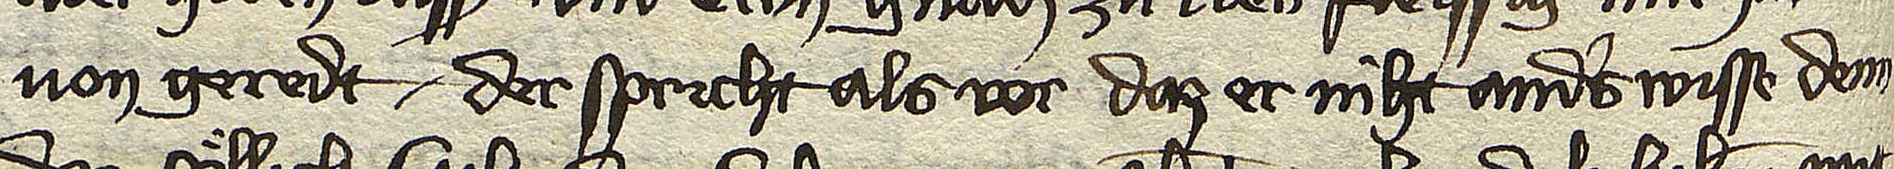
uon geredt / der ſpricht als vor daʒ er niht and*s wiſſe denn
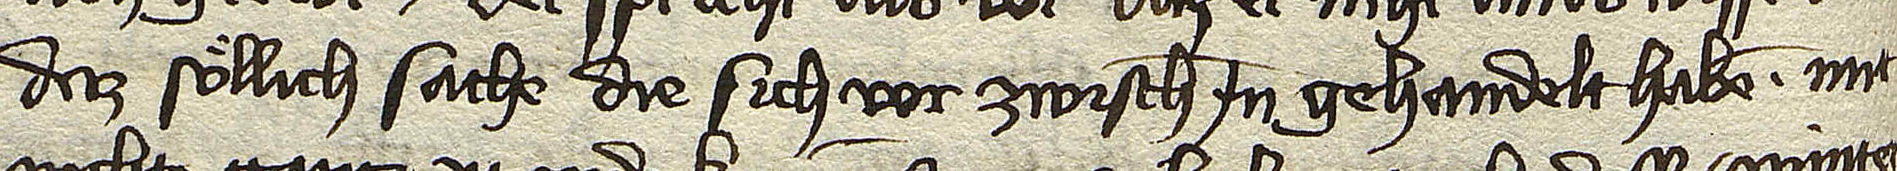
daʒ ſöllich ſache die ſich vor ʒwiſch* In gehandelt habe* . mit
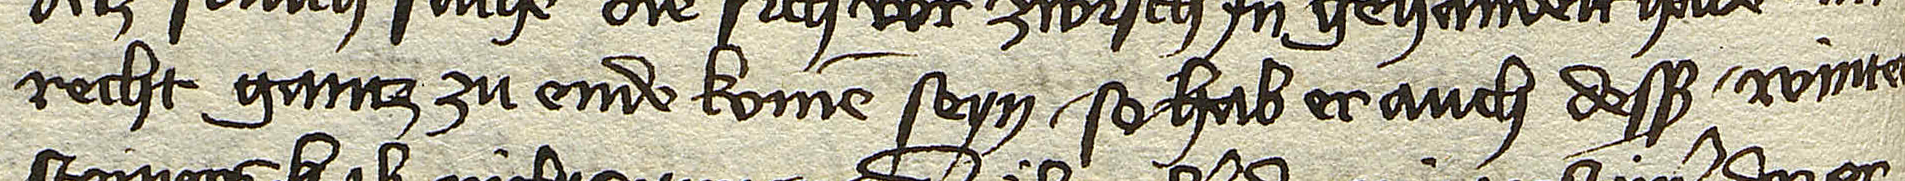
recht gancʒ ʒu ende kome* ſeyn / ſo hab er auch deſſ* / winter
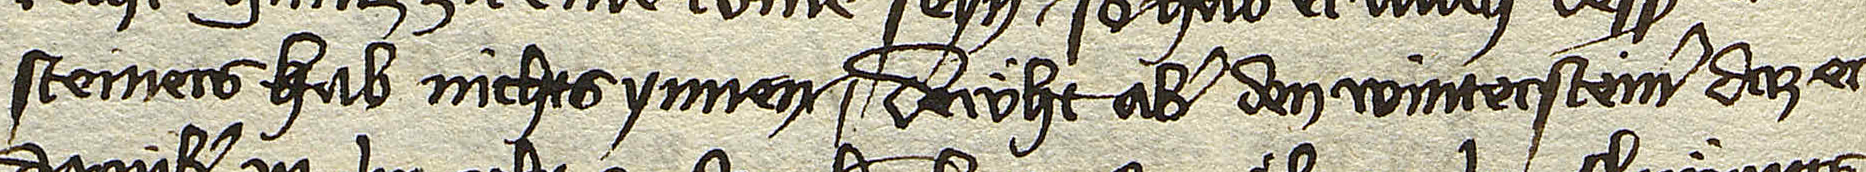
ſteiners hab nichts ynnen / Deẅht ab* den winterſtein* daʒ er
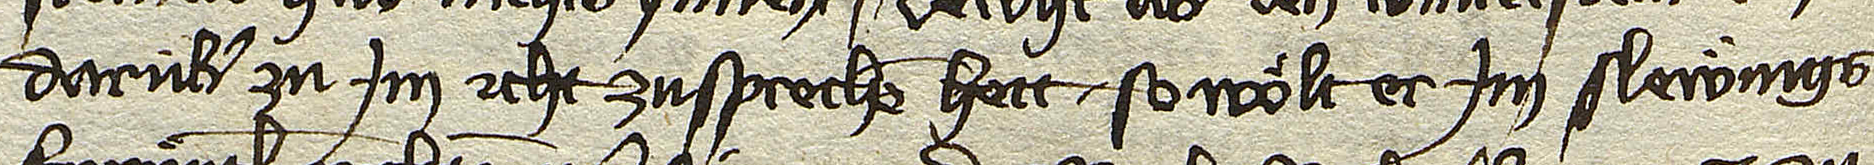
darüb* ʒu Im icht ʒuſpreche* hett / ſo wölt er Im ſleẅnigs
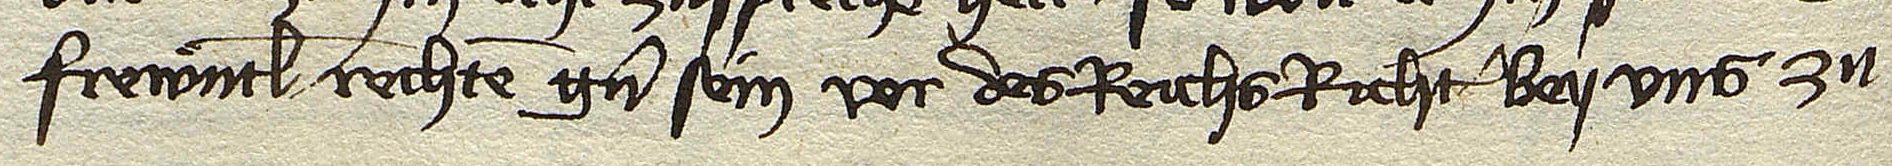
freẅntl* rechte* g*n ſein vor des Reichs Richt* bey vns ʒu
